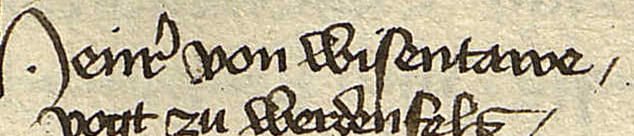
Heinr* von Wiſentawe /
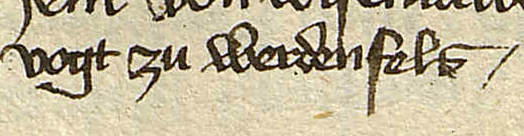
vogt cʒu werdenfels /
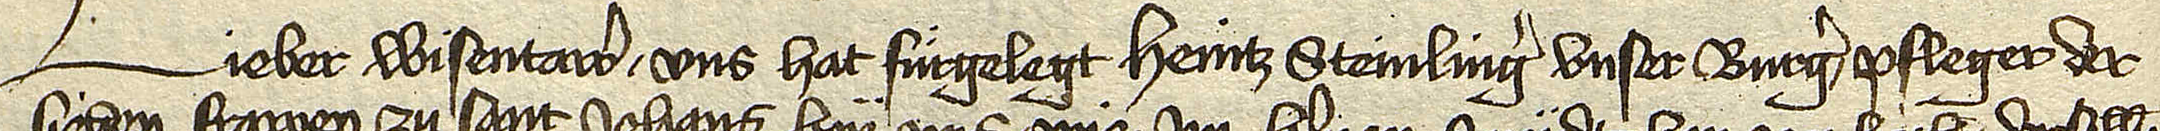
Lieber Wieſentaw* / vns hat fürgelegt heintʒ Steinling* vnſer Burg* / pfleger der
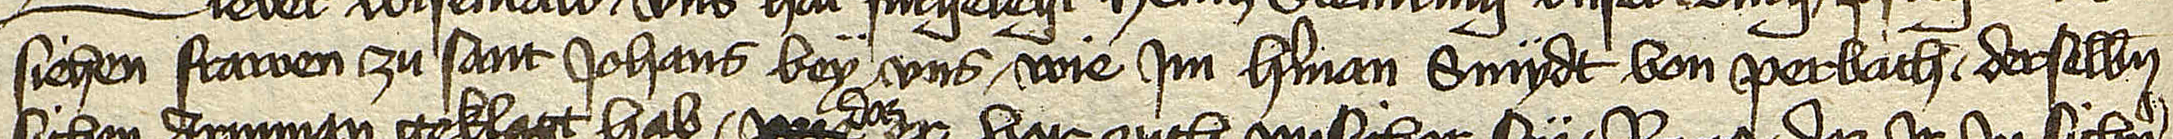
ſiehen frawen cʒu ſant Iohans bey vns / wie Im h*man Smydt von perbach / derſelbn*
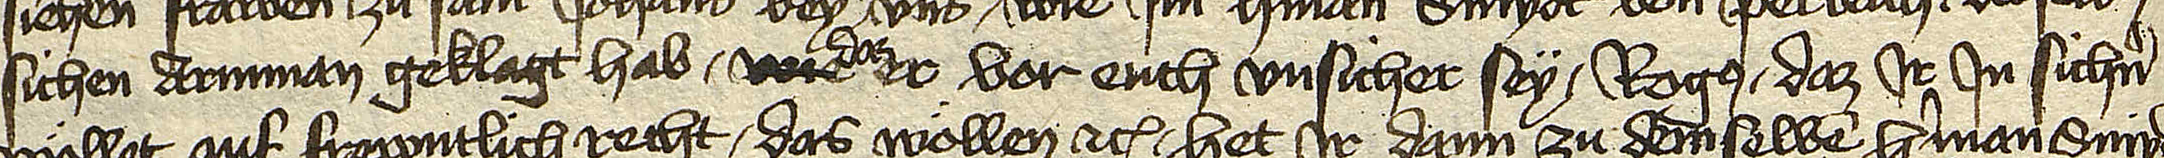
ſichen Armman geklagt hab / wie er vor euch vnſicher ſey / Rog* / daʒ Ir In ſichn*
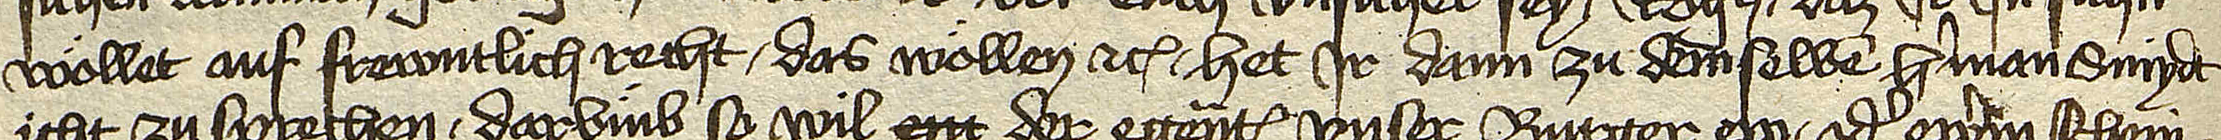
wöllet auf frewntlich recht / das wöllen ec* / het Ir dann cʒu demſelbe* h*man Smydt
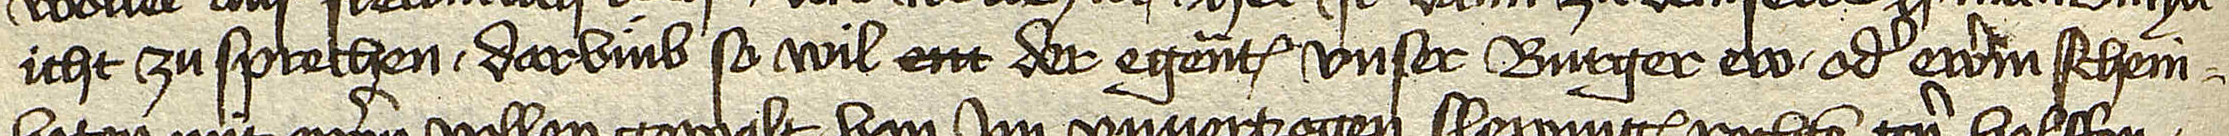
icht cʒu ſprechen / darv̈mb ſo wil ent der egen*t* vnſer Burger ew / od* ew*m ſchein =
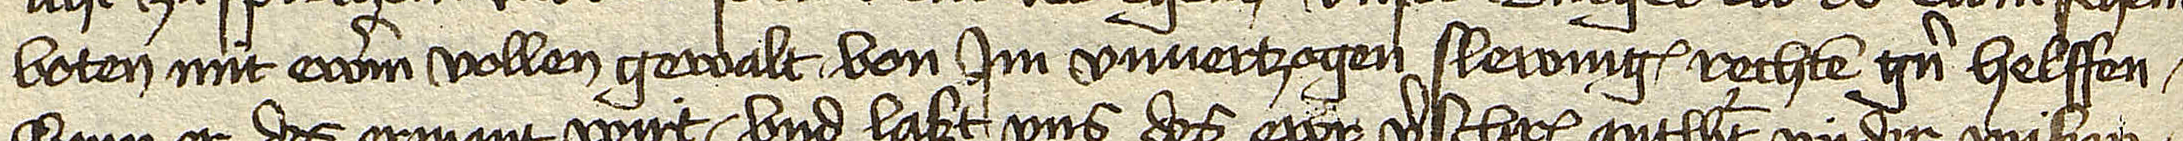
boten mit ewm* vollen gewalt / von Im vnuertʒogen ſlewnig* rechte* gn* helffen /
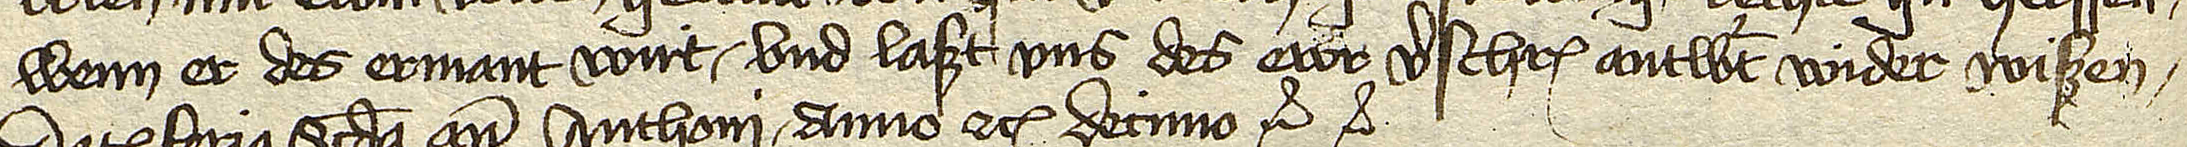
wenn er des ermant wirt / vnd laſʒt vns des ewr v*ſchr* antw*t wider wiſʒen /
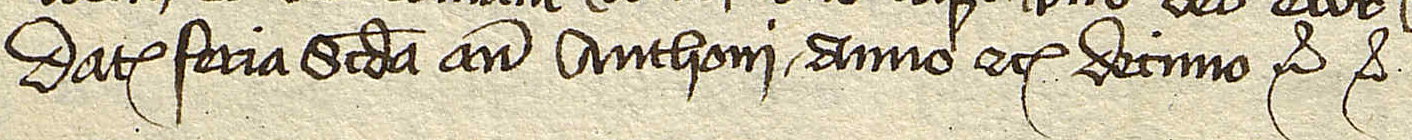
Dat* feria Scda* an* Anthoni / Anno ec* decimo § §
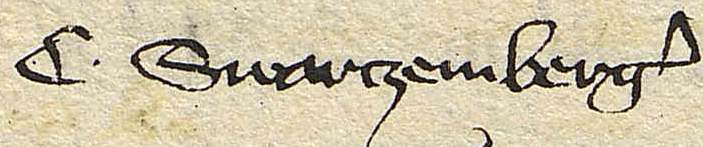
C . Swarcʒemberg*
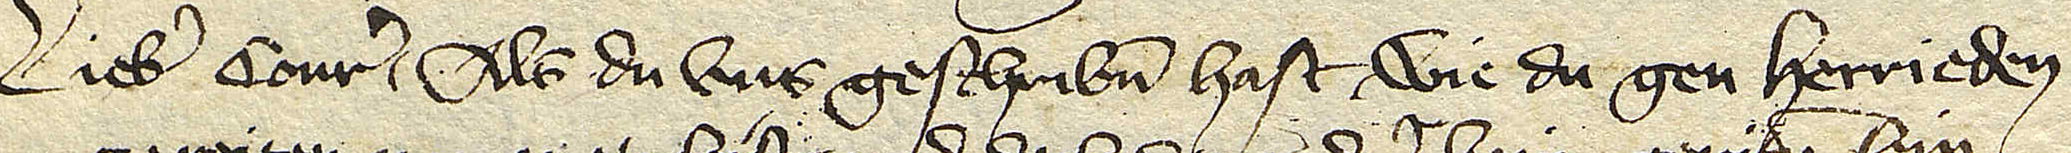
Lieb* Conr* / Als du vns geſchribn* haſt / wie du gen herrieden
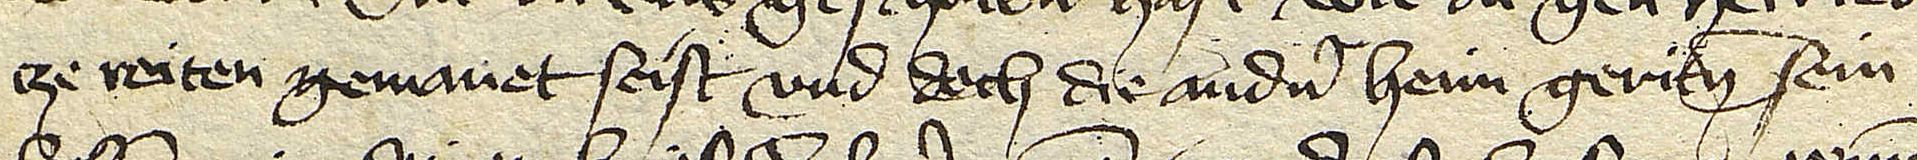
cʒe reiten gemanet ſeiſt vnd doch die andn* heim geritn* ſein
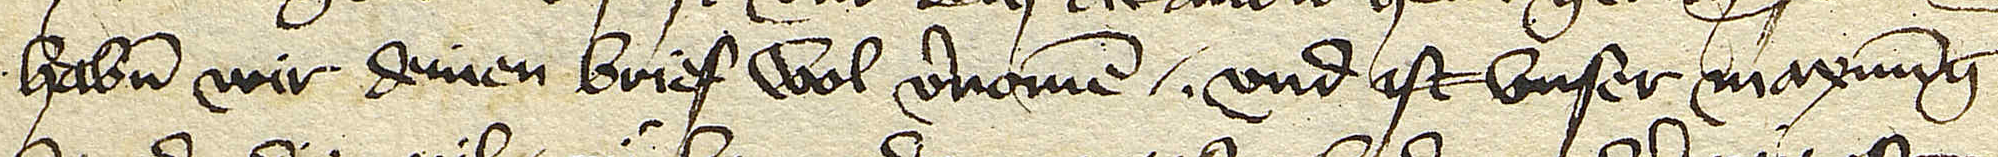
habn* wir deinen brief wol v*nome* / . vnd iſt vnſer maynu*g
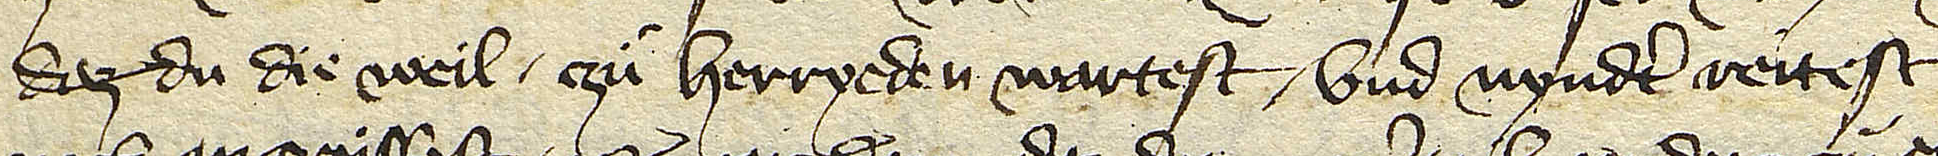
daʒ du die weil cʒü herryeden warteſt / vnd nyndt* reiteſt
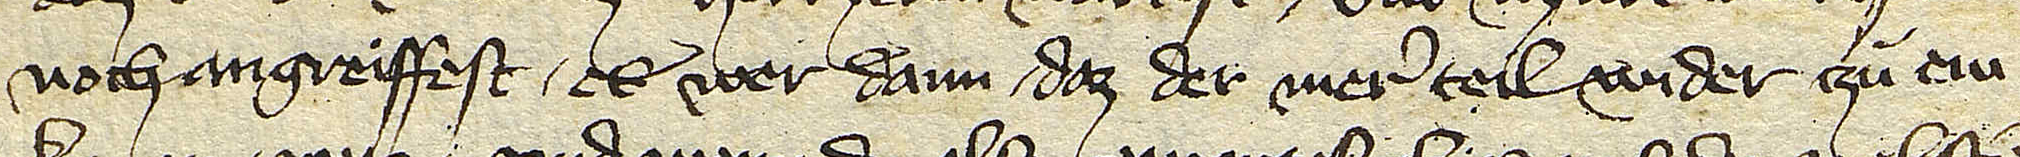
noch angreiffeſt / es wer dann / daʒ der mer* teil wider cʒü ew
